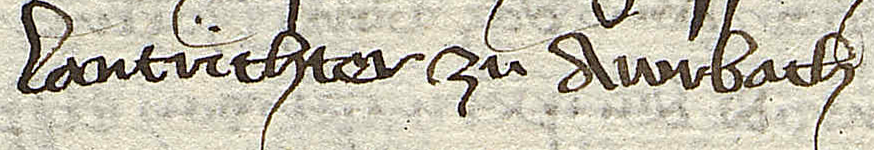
lantrichter cʒu Awrbach
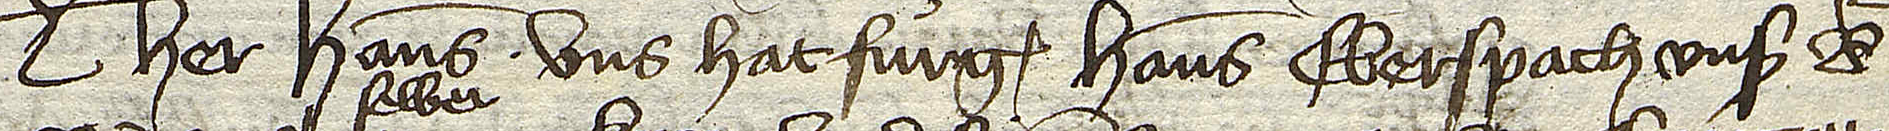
L* her Hans* . vns hat fürg* Hans* Eberſpach vnſ* B*
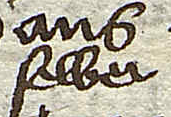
ſelber
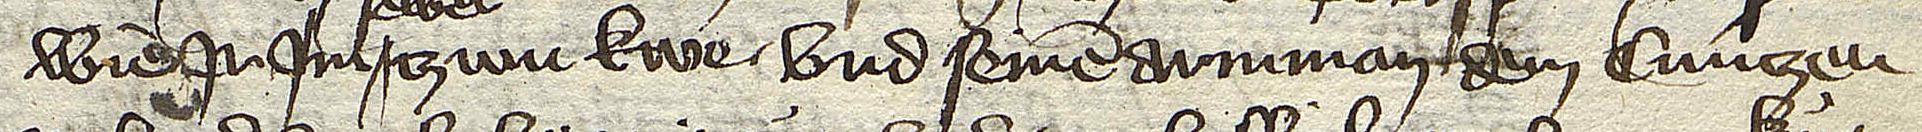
wie Ir Im cʒwu kwe . vnd ſeine* Armman dem Cuncʒen
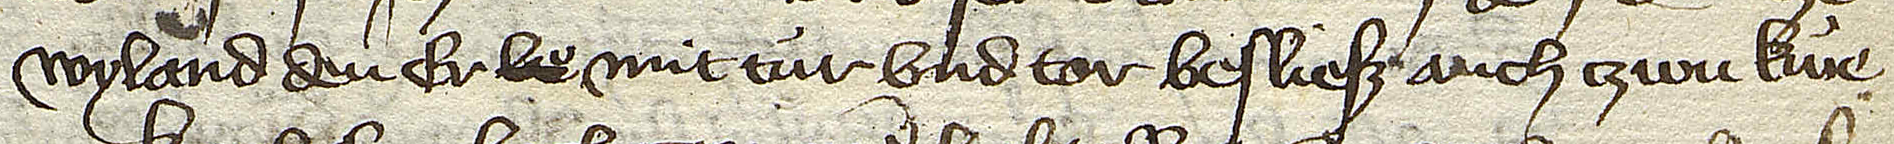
wyland den Er be mit tür vnd tor beſlieſʒ auch cʒwu kẅe
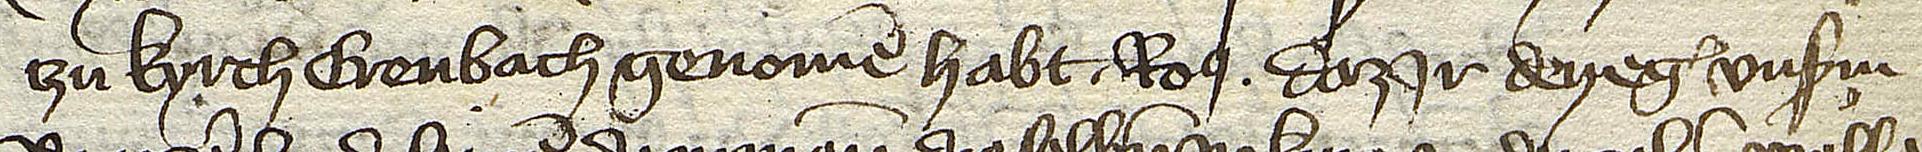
cʒu kyrch Erenbach genome* habt . Ro* . daʒ Ir den eg* vnſ*m
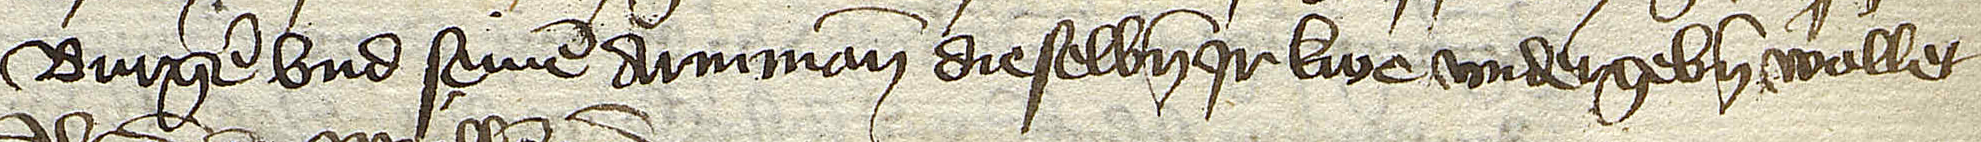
Burge* vnd ſeine* Armman* dieſelb*n Ir kwe widergeb*n wöllet
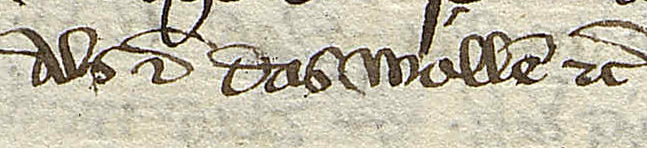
Als ec* das wölle* ec*
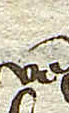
vo*
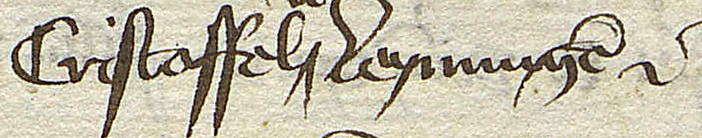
Criſtoffel Leyminge* ec*
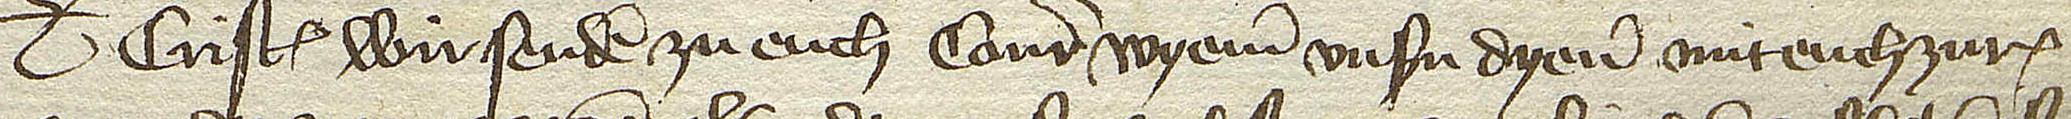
L* Criſt* wir ſend* cʒu euch Conr* wyem* vnſ*n dyen* mit euch ʒur*
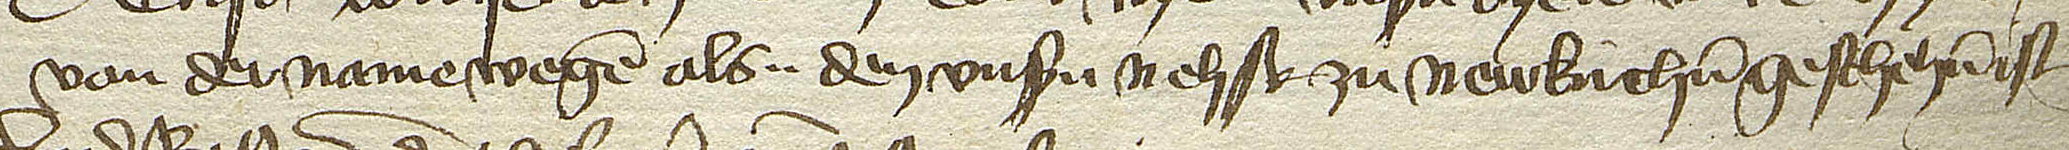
von der name wege* als ~ den vnſ*n nehſt cʒu newkirch*n geſcheh*n iſt
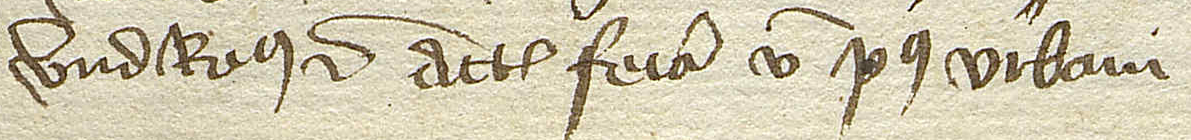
vnd Ro* ec* Act* feia* v* p* Vrbani
